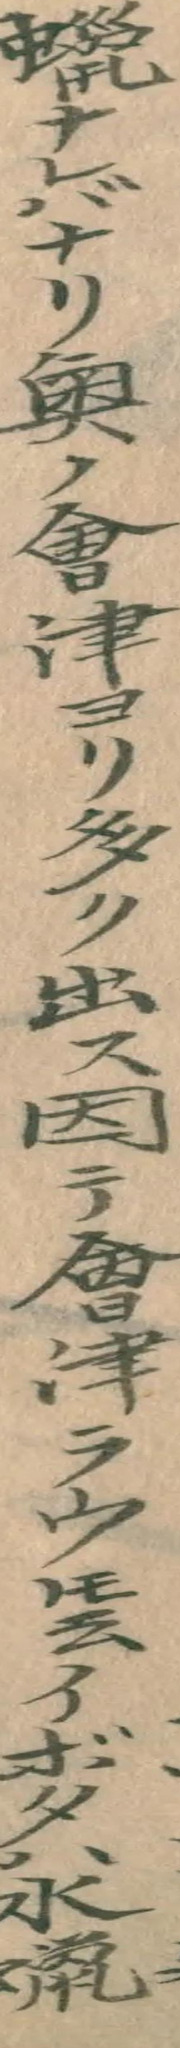蠟ナレバナリ奥ノ會津ヨリ多ク出ス因テ會津ラウトモ云イボタハ水蠟
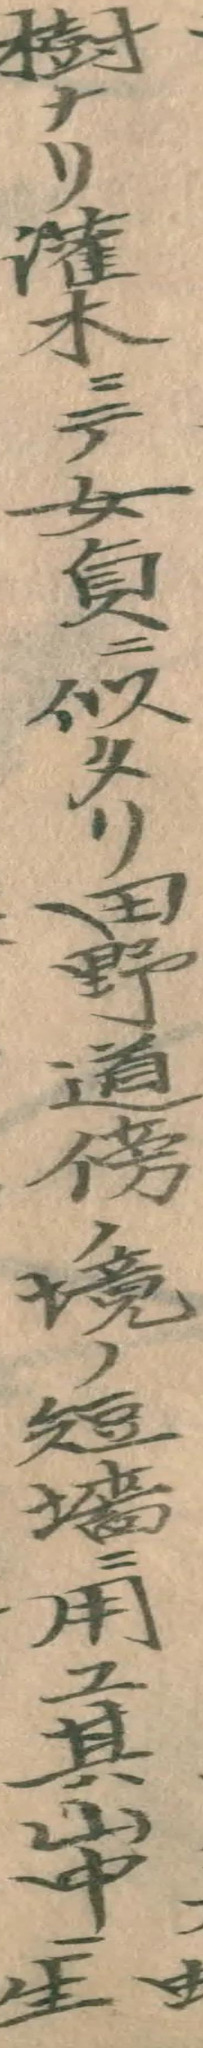樹ナリ灌木ニテ女貞ニ似タリ田野道傍ノ境ノ短墻ニ用ユ其山中ニ生
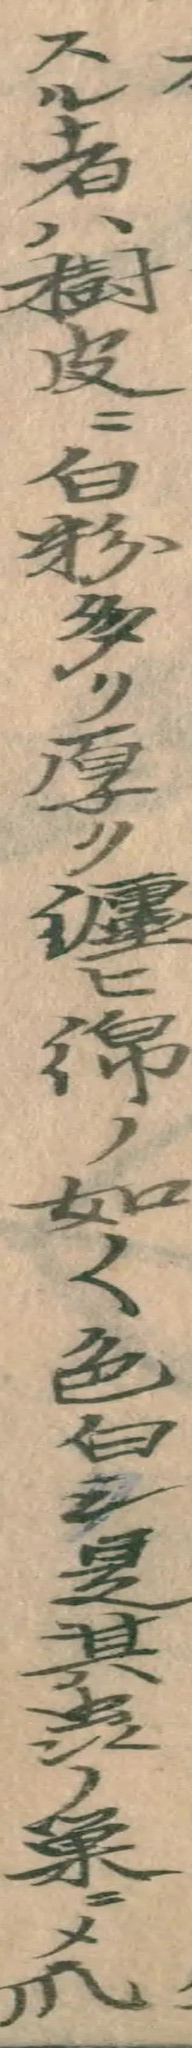スル者ハ樹皮ニ白粉多ク厚ク纏ヒ綿ノ如く色白シ是其蟲ノ巢ニシテ爪
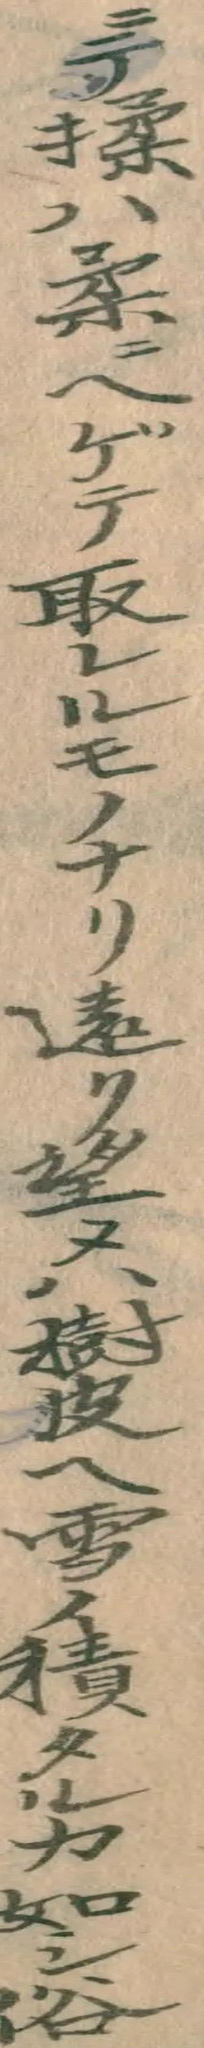ニテ揉ハ柔ニヘゲテ取レルモノナリ遠ク望メハ樹皮ヘ雪ノ積タルガ如シ俗
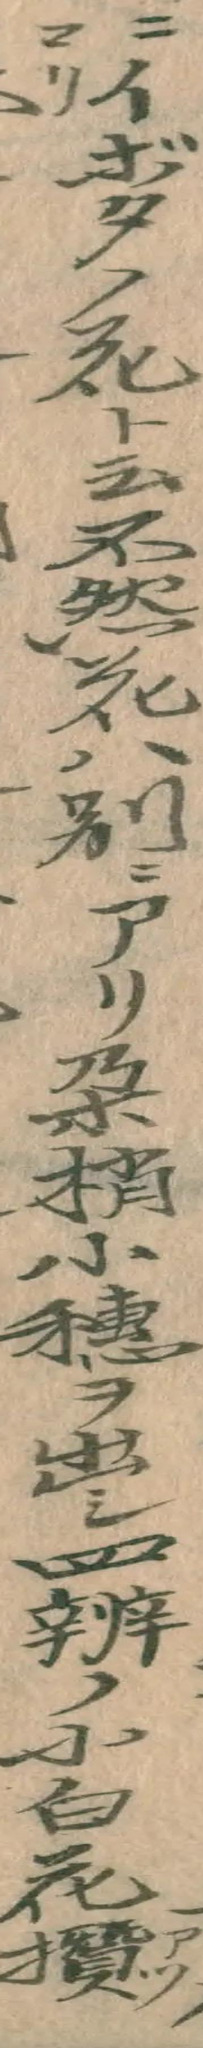ニイボタノ花ト云不然花ハ別ニアリ朶梢小穂ヲ出シ四辨ノ小白花攢
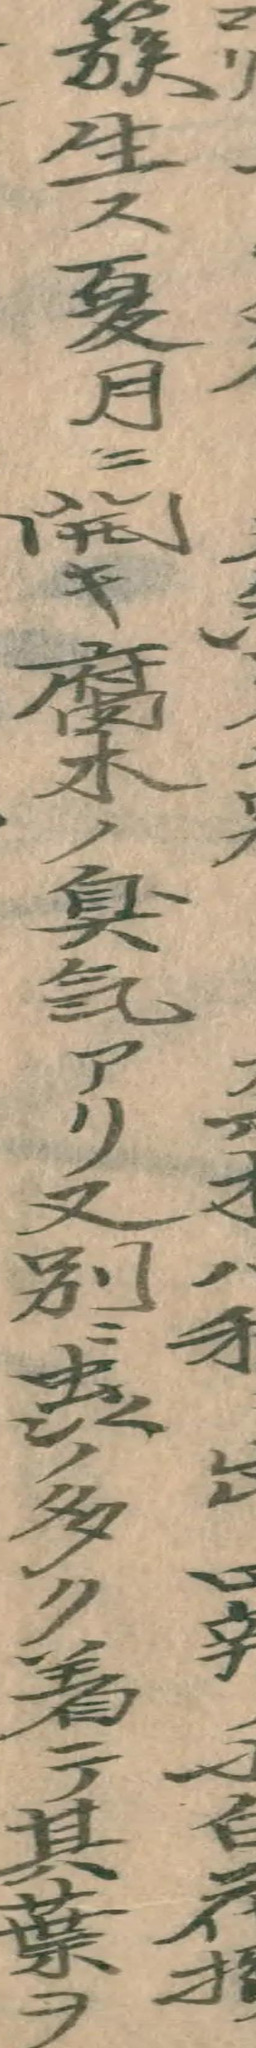簇生ス夏月ニ開キ腐木ノ臭気アリ又別ニ蟲ノ多ク着テ其葉ヲ
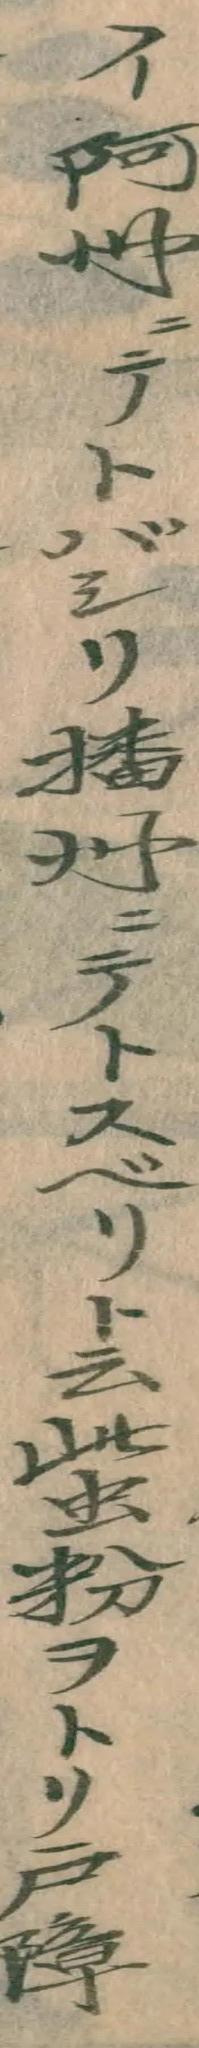イ阿州ニテトバシリ播州ニテトスベリト云此虫粉ヲトリ戸障
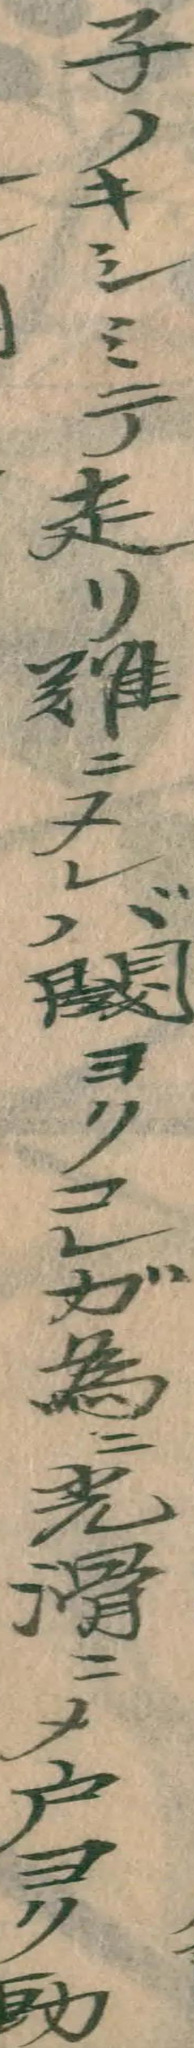子ノキシミテ走リ難ニヌレバ閾ヨリコレガ為ニ光滑ニシテ戸ヨリ動
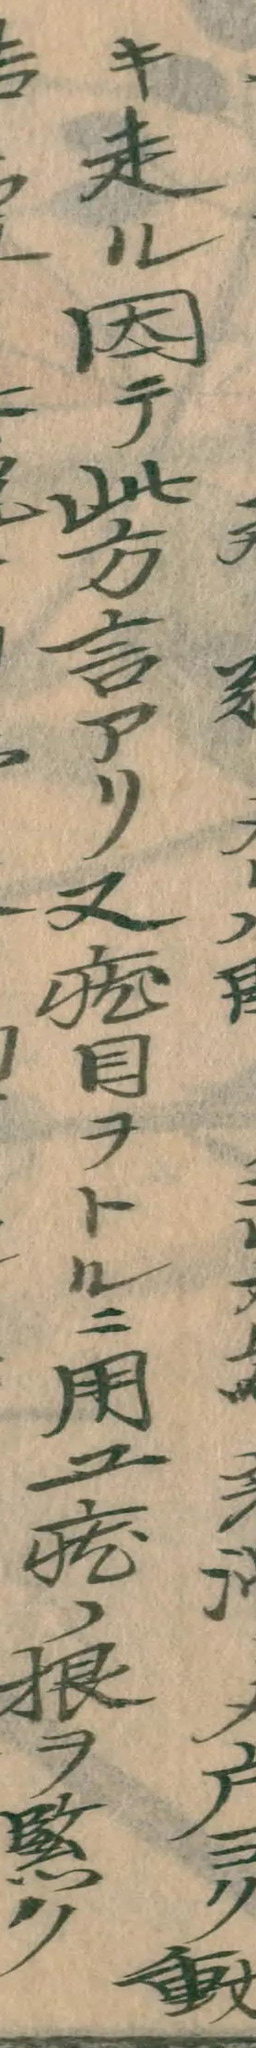キ走ル因テ此方言アリ又疣目ヲトルニ用ユ疣ノ根ヲ緊ク
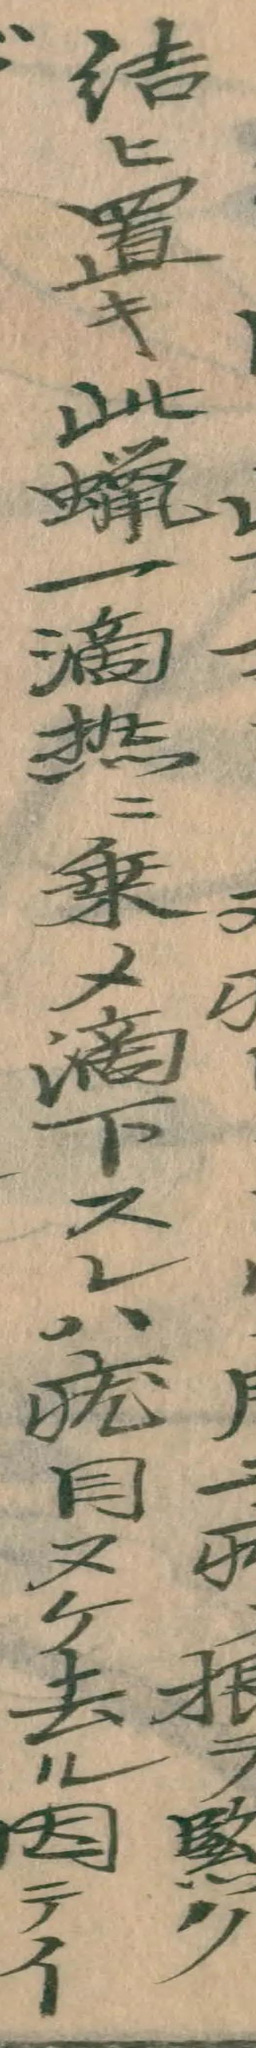結ヒ置キ此蠟一滴熱ニ乗シテ滴下スレハ疣目ヌケ去ル因テイ
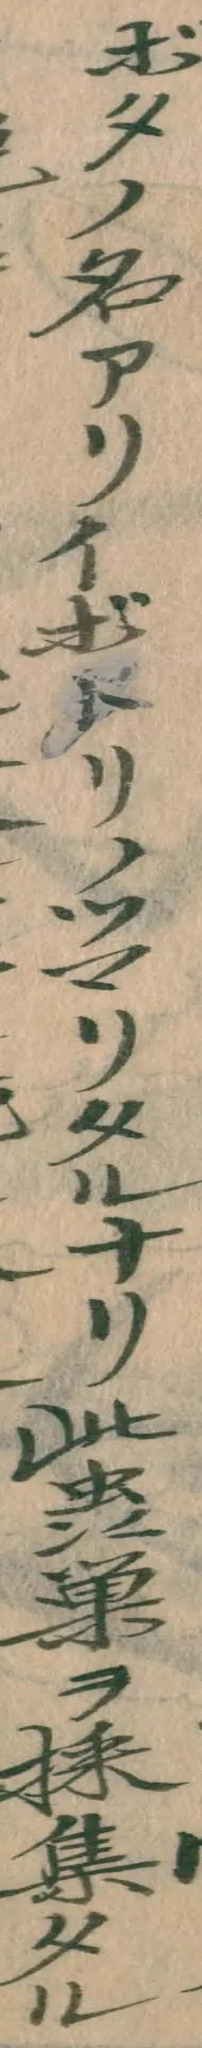ボタノ名アリイボトリノツマリタルナリ此蟲巣ヲ採集タル
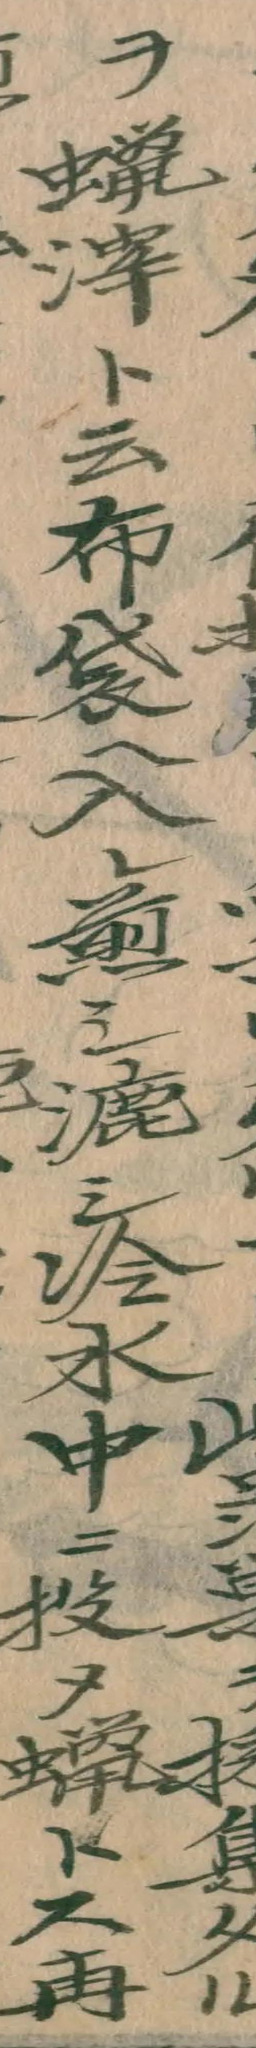ヲ蠟滓ト云布袋ヘ入レ煎シ漉シ冷水中ニ投シテ蠟トス再
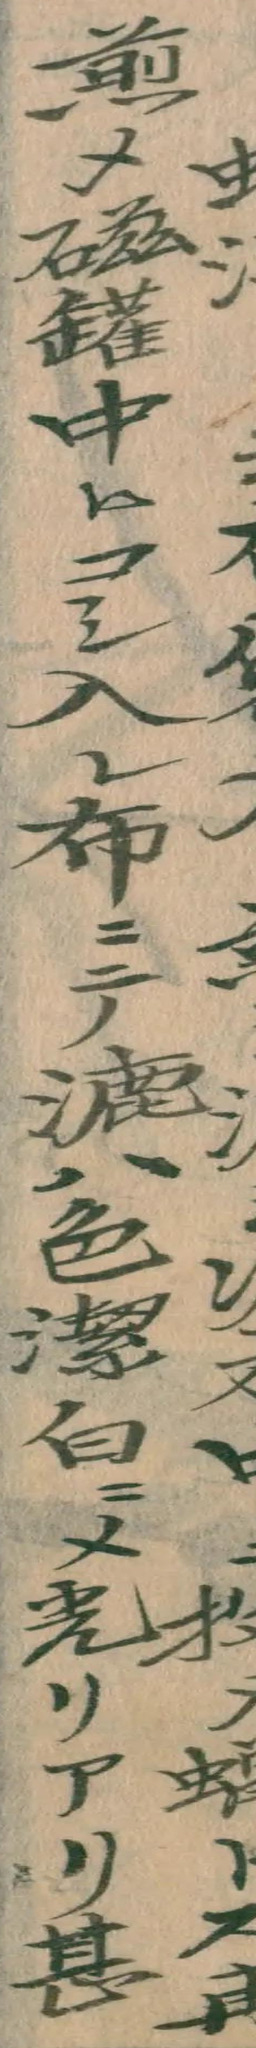煎シテ磁罐中ヘコシ入レ布ニテ漉ハ色潔白ニシテ光リアリ甚
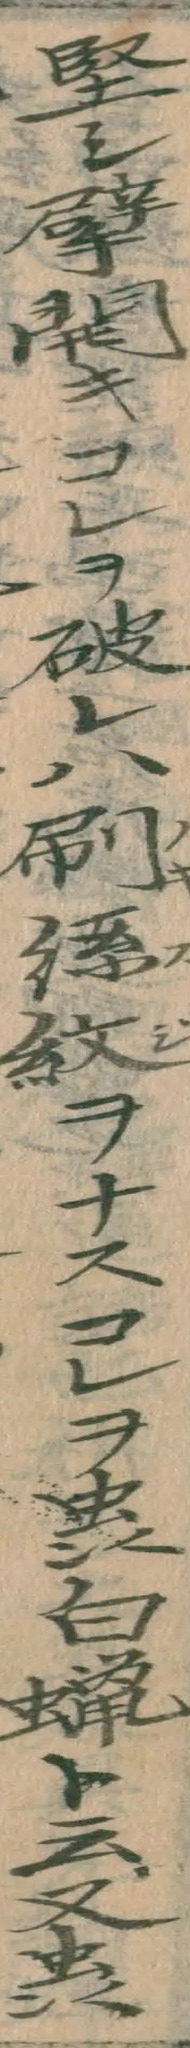堅シ擘開キコレヲ破レハ刷絲紋ヲナスコレヲ蟲白蠟ト云又蟲
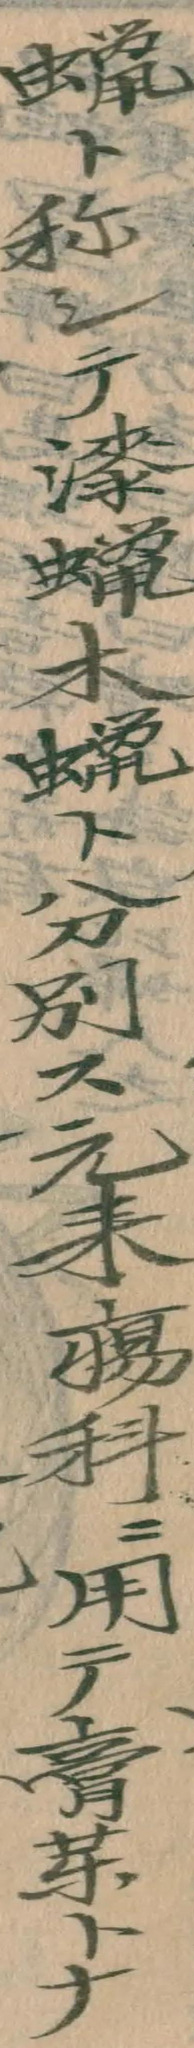蠟ト称シテ漆蠟木蠟ト分別ス元来瘍科ニ用テ膏薬トナ
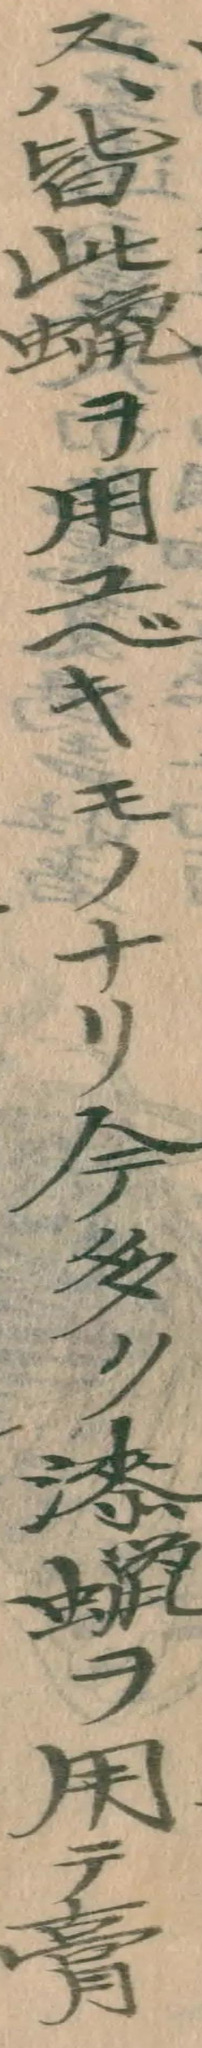スハ皆此蠟ヲ用ユベキモノナリ今多ク漆蠟ヲ用テ膏
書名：千蟲譜 3巻. [1]
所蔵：国立国会図書館 National Diet Library, JAPAN
